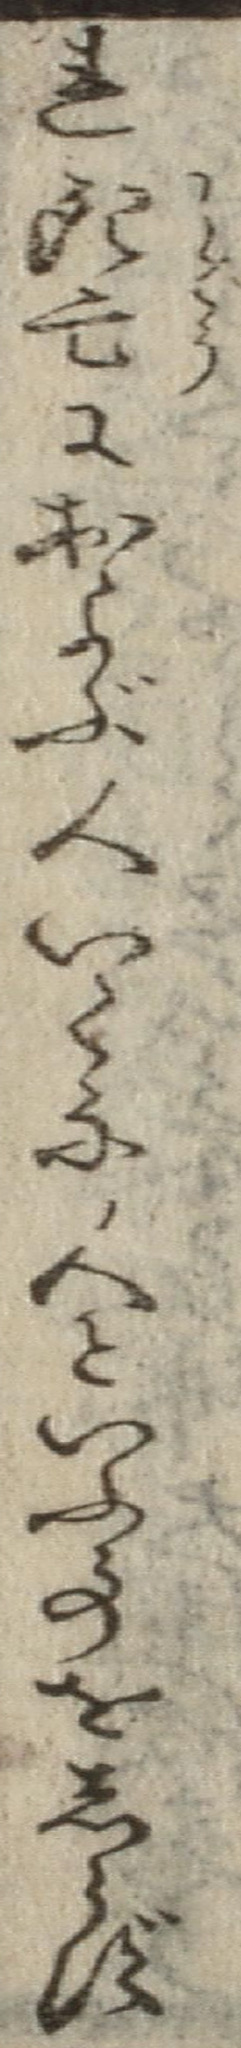れ死亡におよぶ人いくに人といふ事をしらず
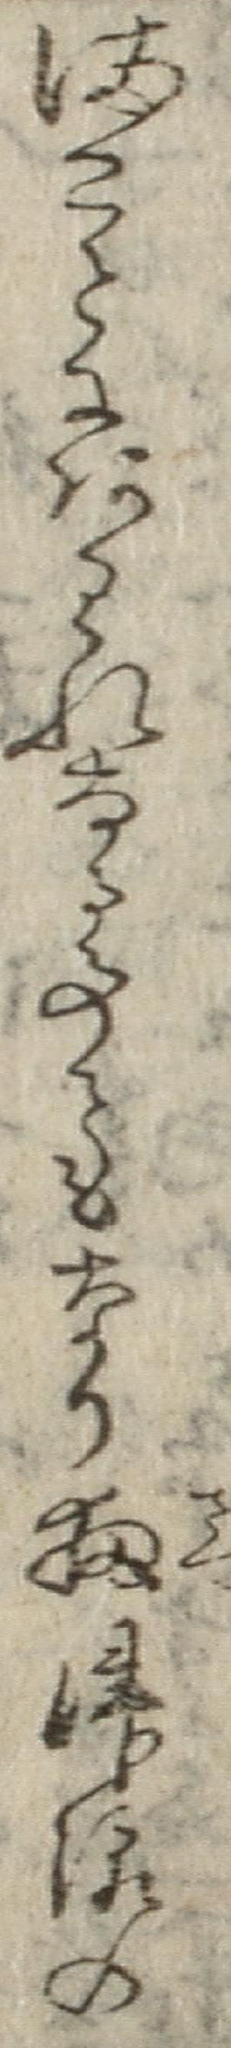まことにあわれなる事ともなり扨津浪の
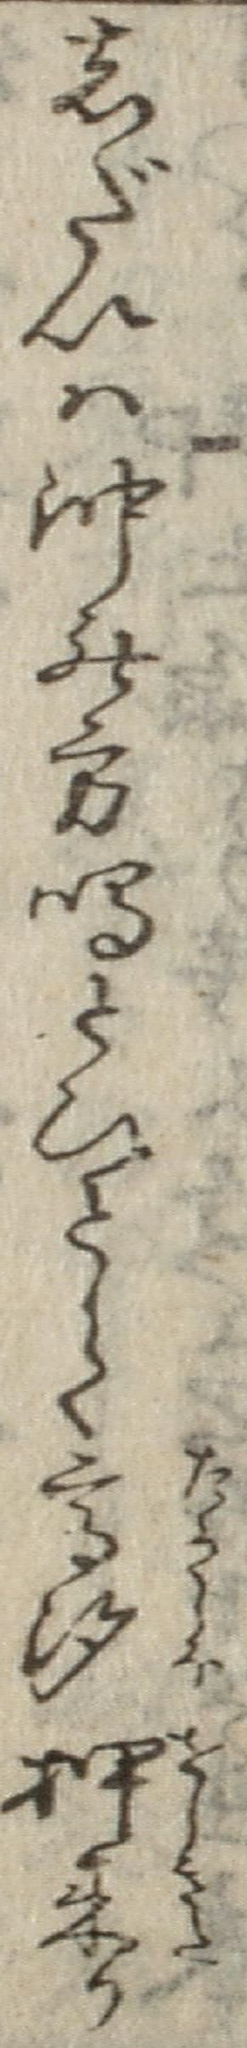しだいハ沖の方鳴とひとしく高汐押来り
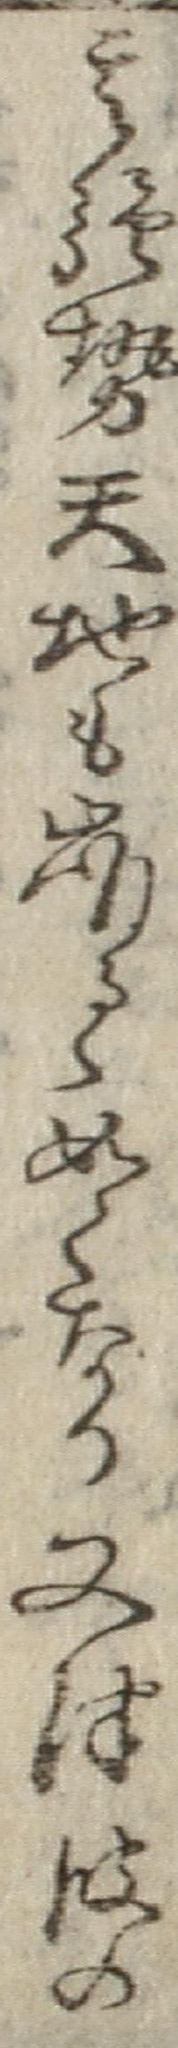て強勢天地も崩るゝ如くなり又津波の
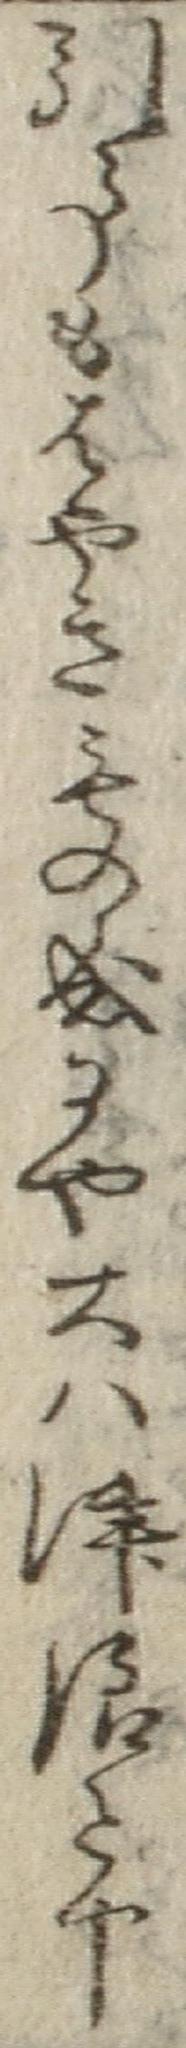引事もはやきもの成にやスハ津浪と申
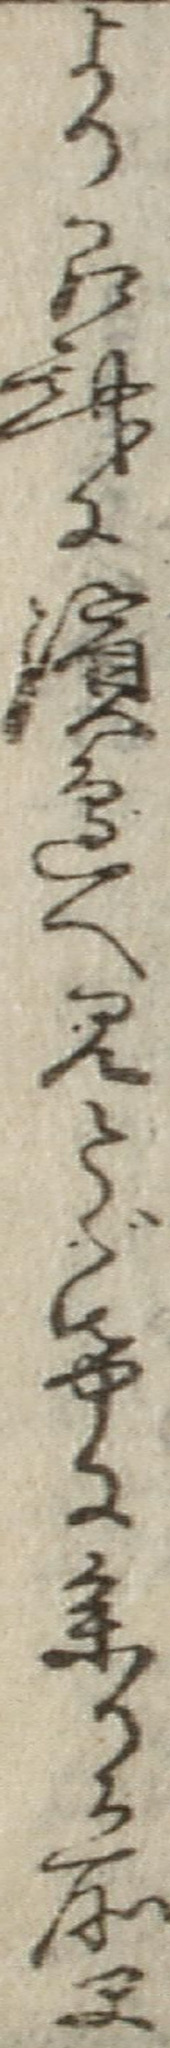より即刻に濱辺へ見とゞけに参り候所に
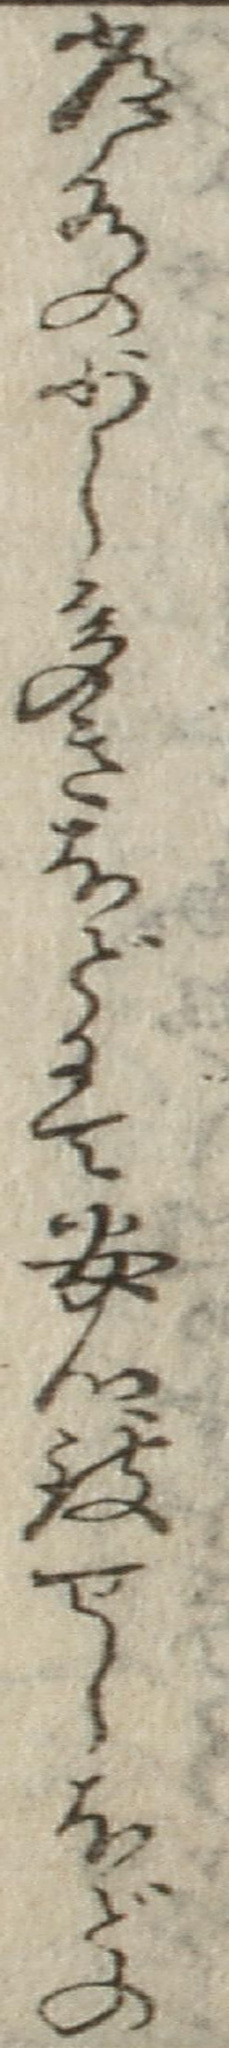常水の少し多きなどにて安心致せしほどの
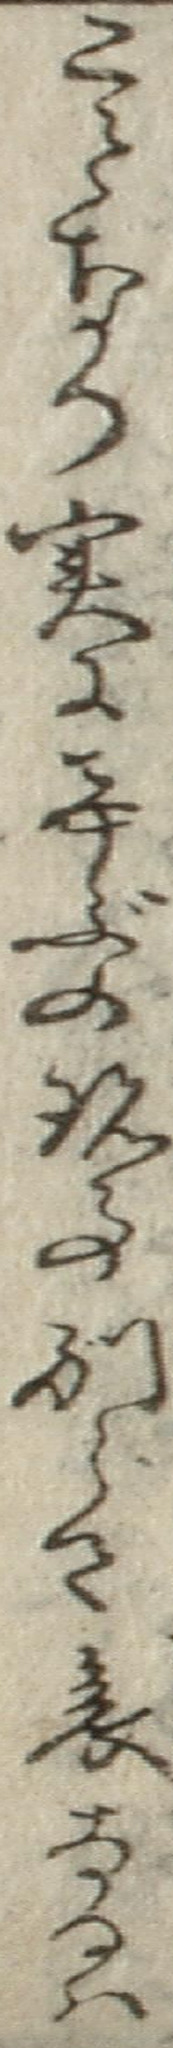ことなり実にけぶの珍事別して哀なるハ
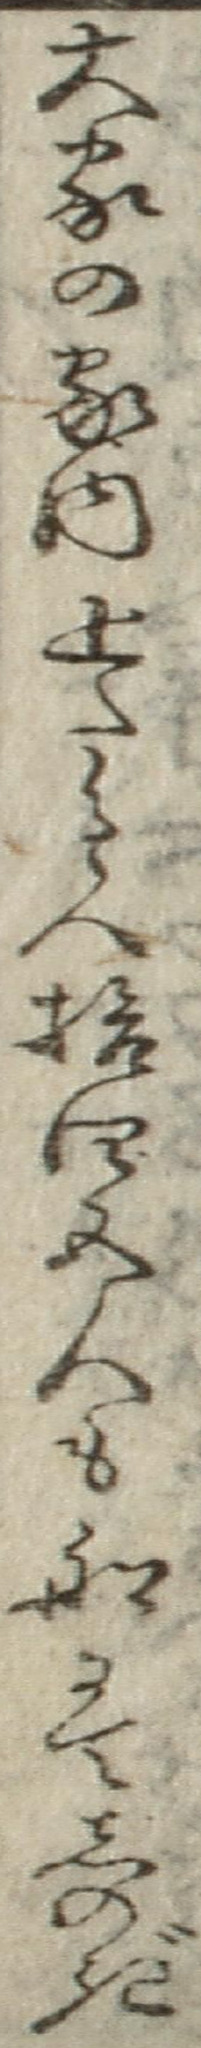大家の家内止たるゝ人拾四五人も船にてしのぎ

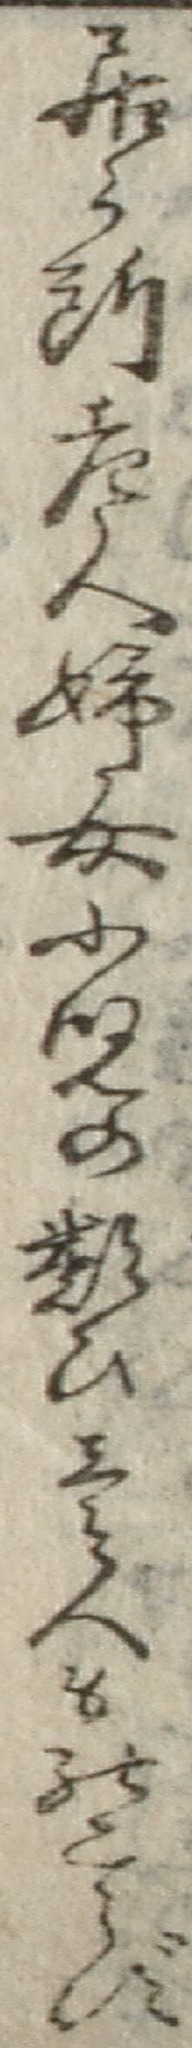居候処老人婦女小児の類ひ壱人ものこらず
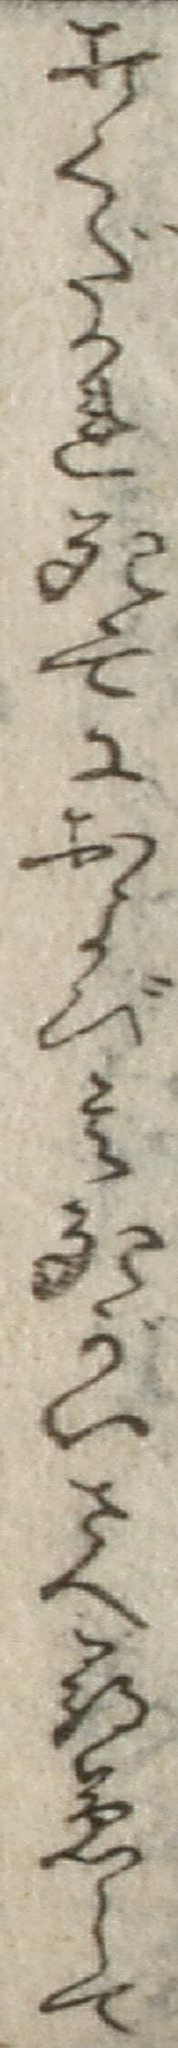打くだかれ死亡におよび其死がいさへ尋兼して
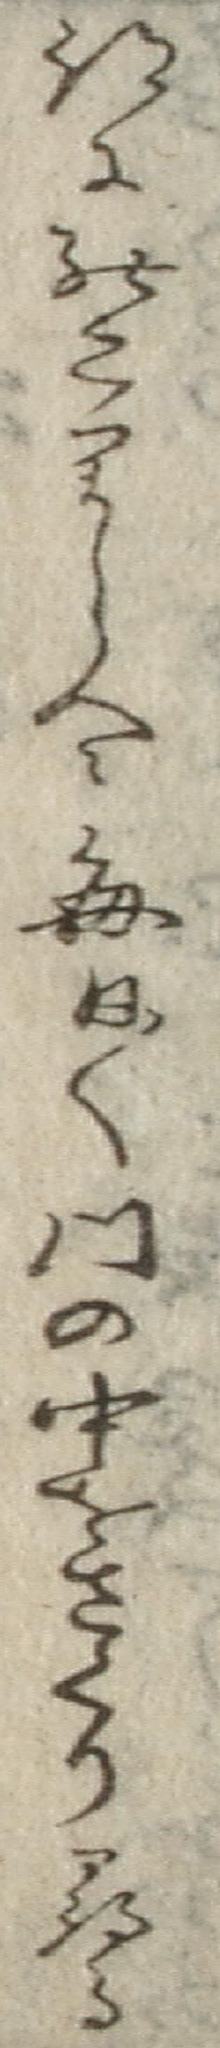跡にのこりし人〻毎日〳〵川の中をさくり尋る
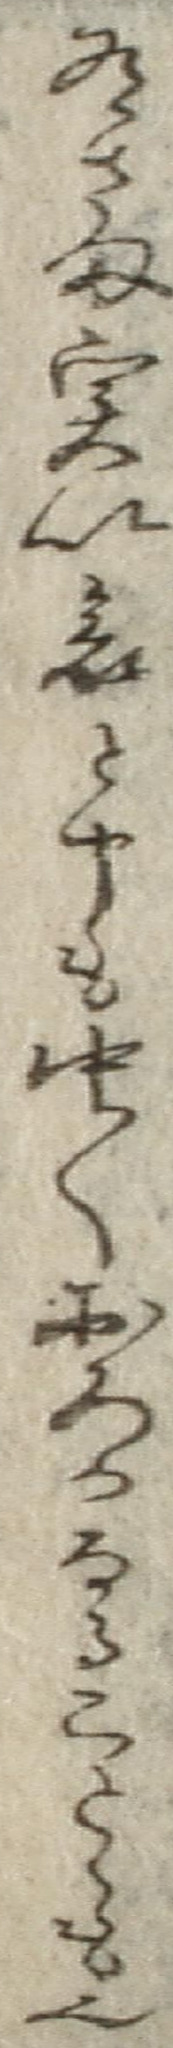有さま実以哀と申も中〻おろかなることとも也
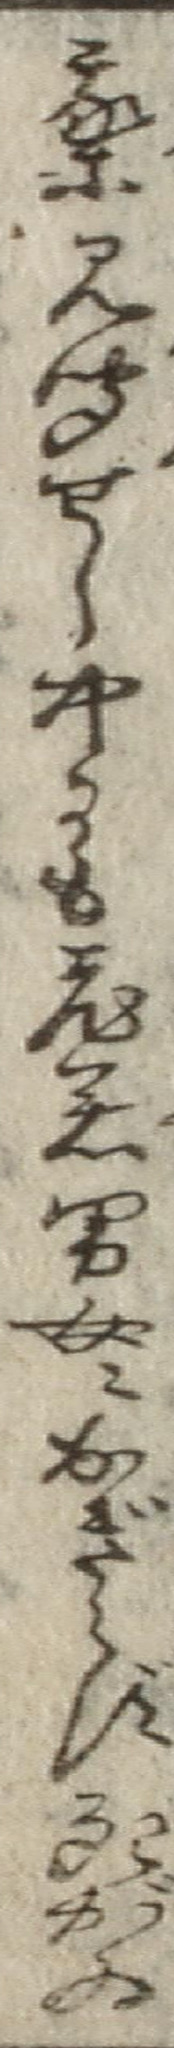我等見聞せし中にも老若男女ニかぎらず死がゐ
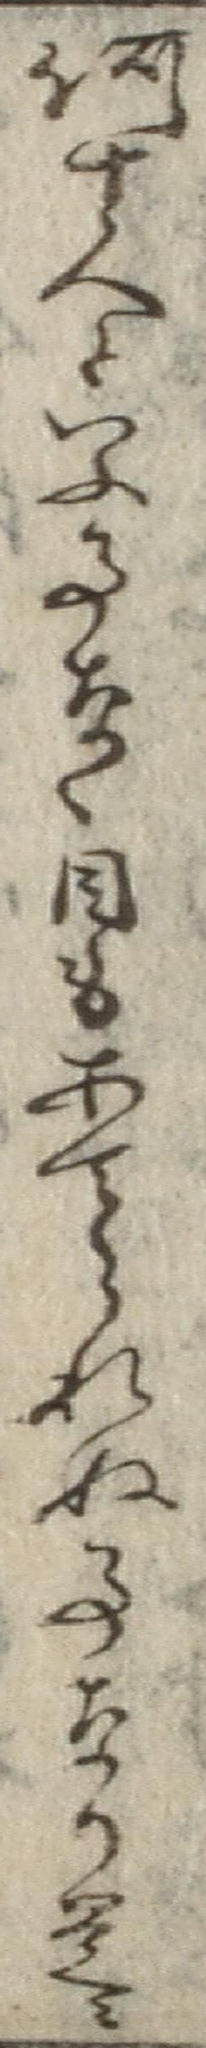何十人といふ事なく目もあてられぬことなり是ニ
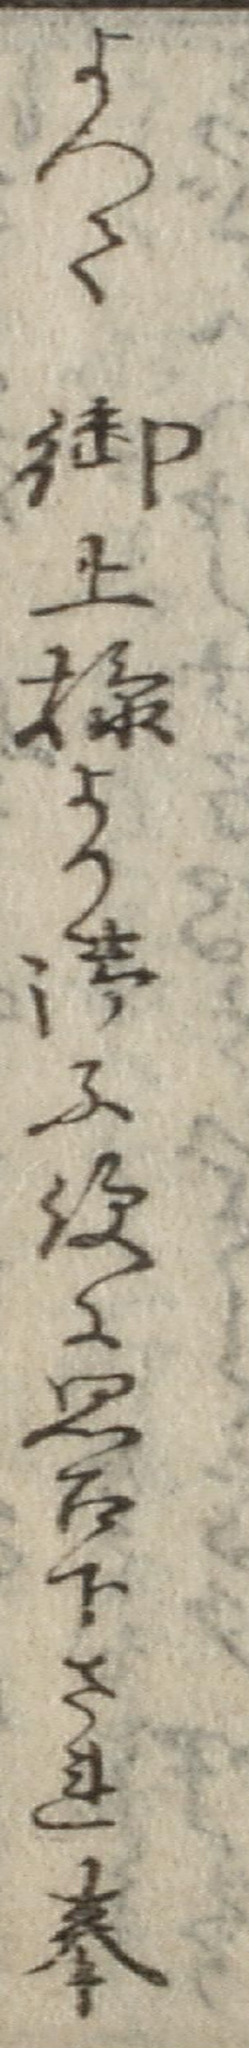よつて御上様より御不便に思召下され奉
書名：世直り艸紙
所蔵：東京大学地震研究所図書室 Earthquake Research Institute Library, The University of Tokyo, JAPAN
